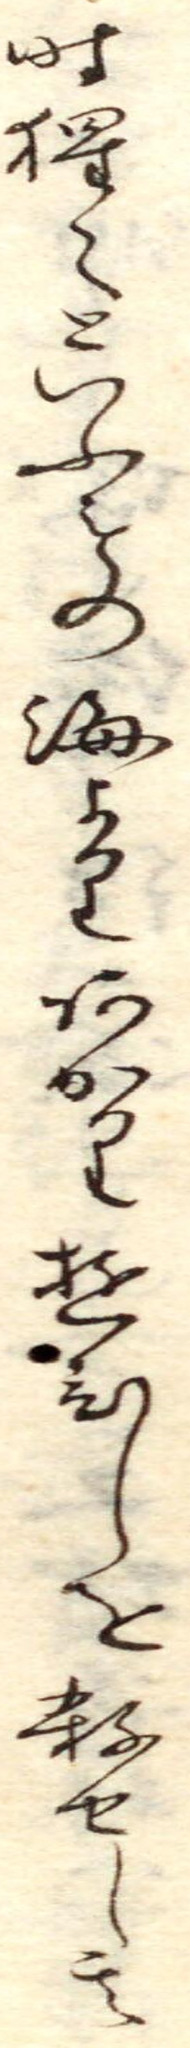時猩々といふもの海よりあかり遊ひしを殺せし其
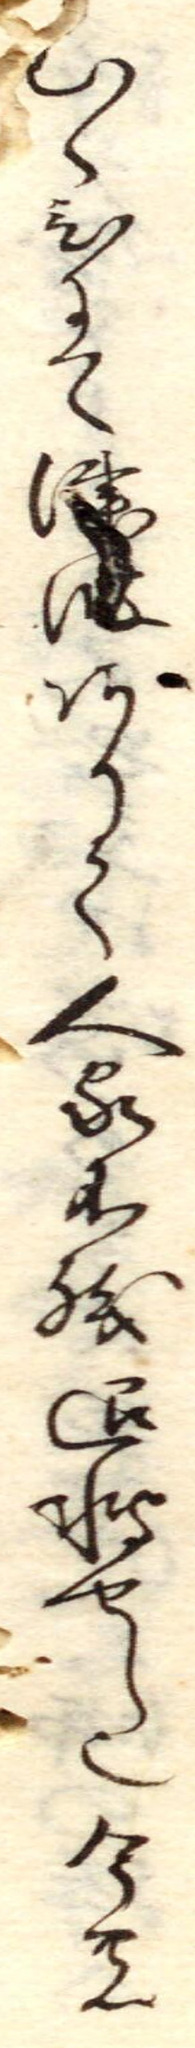むくひにて津波ありて人家不残退破せし也今の
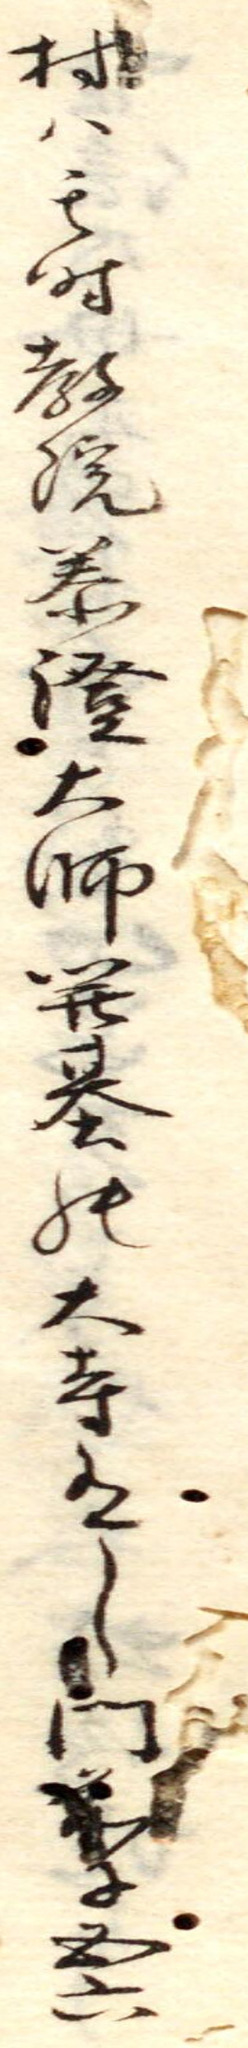村は其時教院泰澄大師開基の大寺有し門前に五六
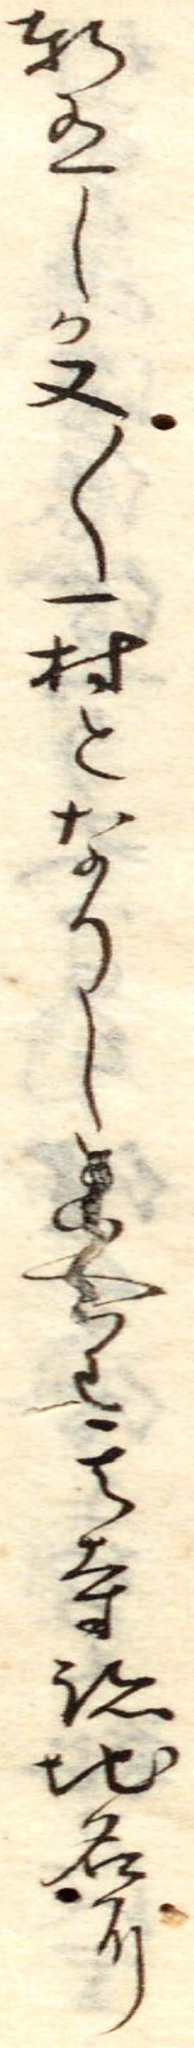軒有しか又〳〵一村となりしといへり其寺跡地名に
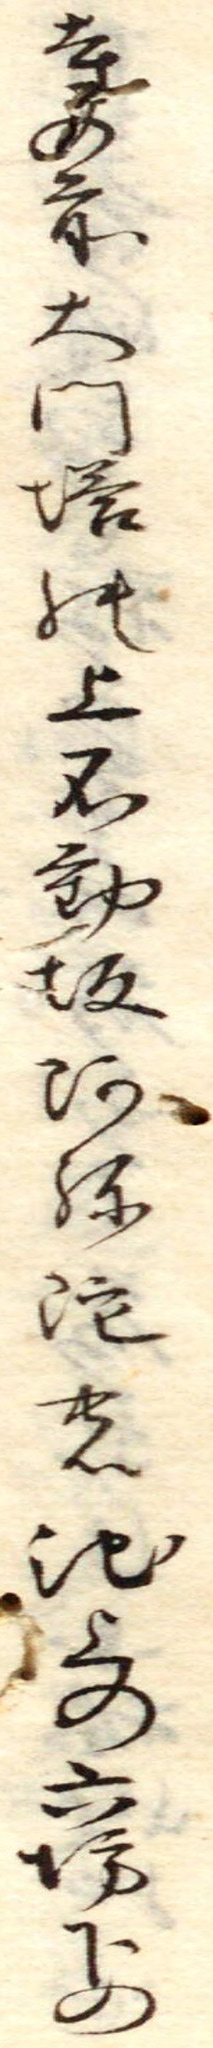寺の前大門塔の上不動坂阿弥陀の池上の六坊下の
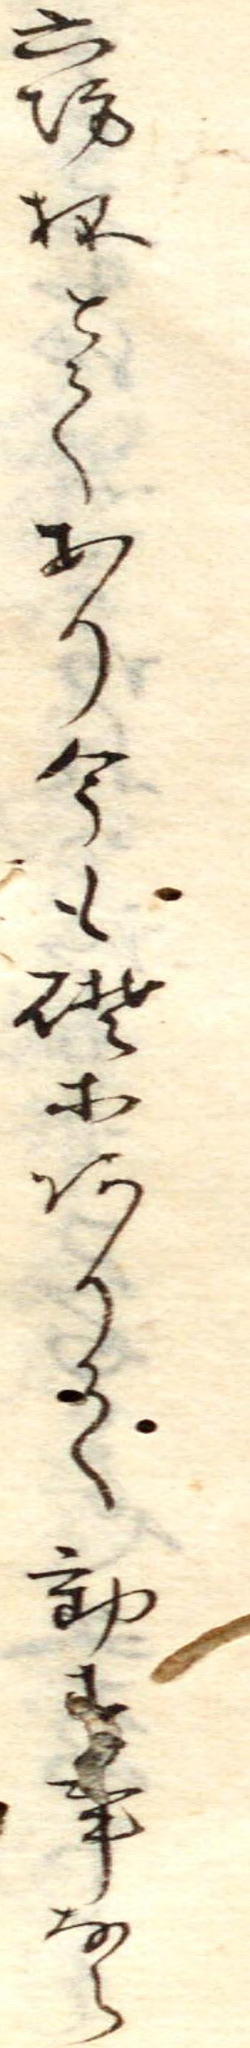六坊抔とてあり今も礎等ありて動す事なら
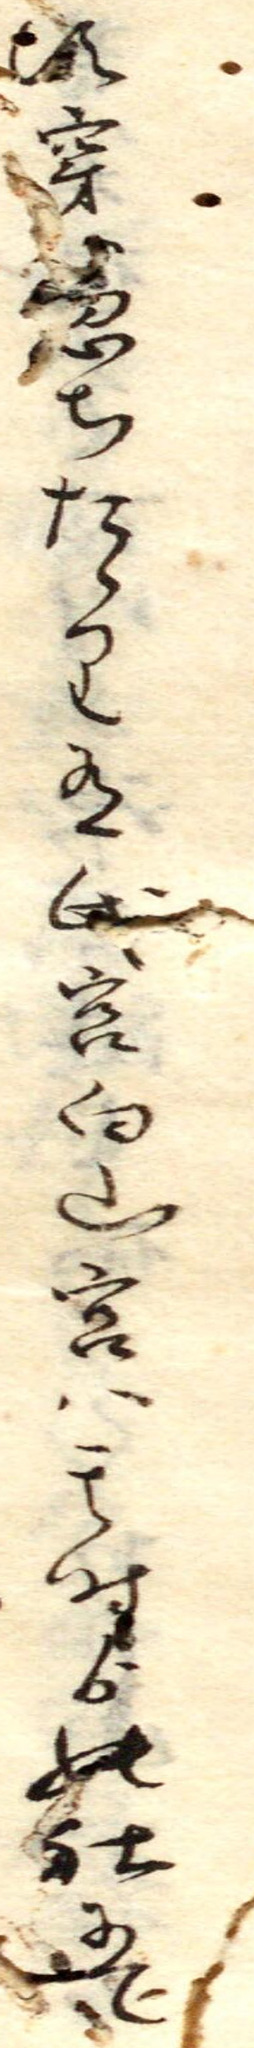す穿忽ちたゝり有氏宮白山宮は其時ゟの社にて

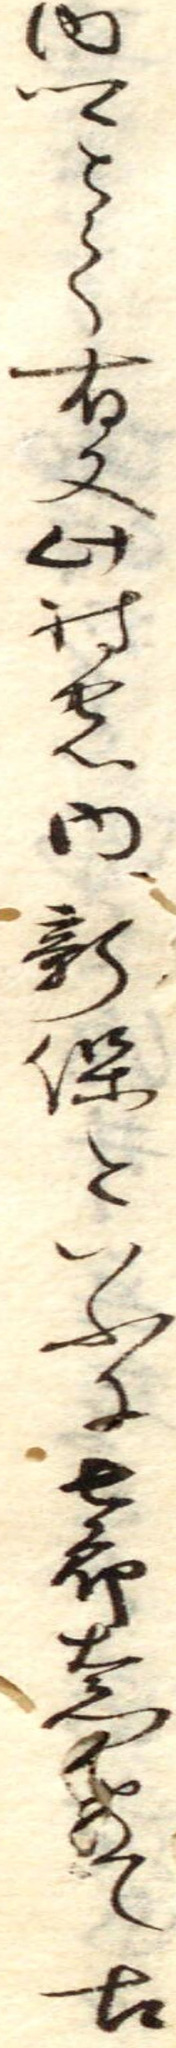内門とて有又此村の内新保といふに七郎右衛門とて古
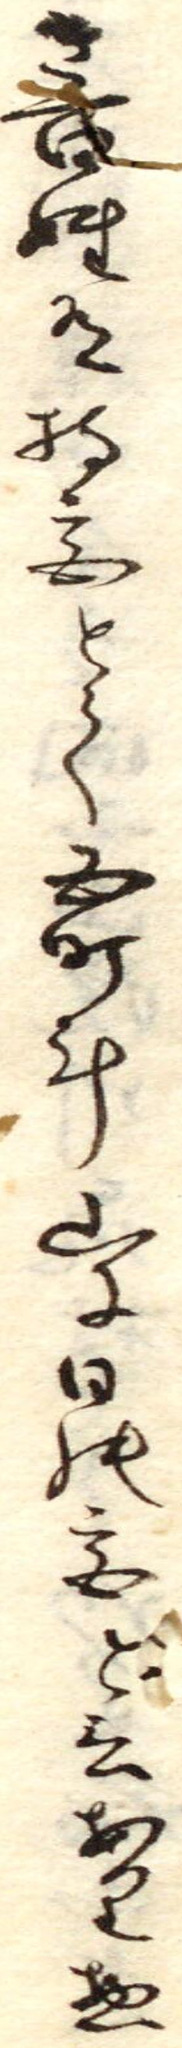き百姓有持宮とて五町斗山に日の宮と云あり惣
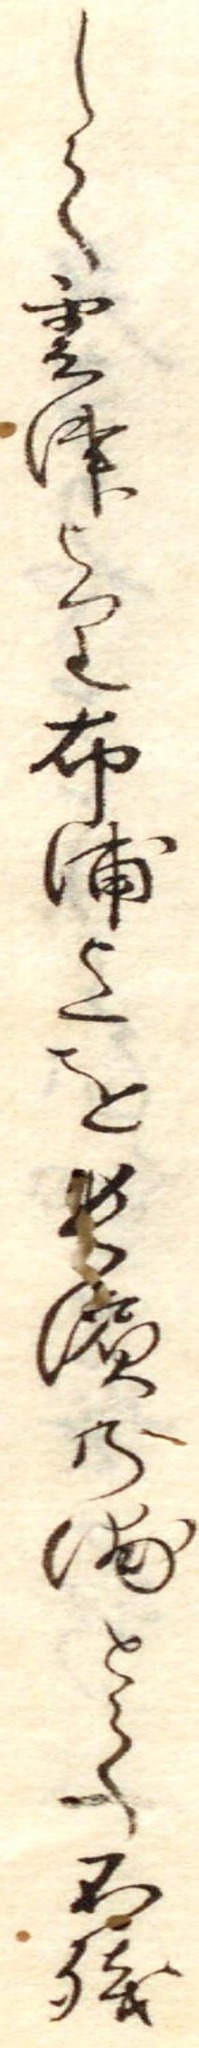して雲津より布浦迄を長浜の浦とて不残
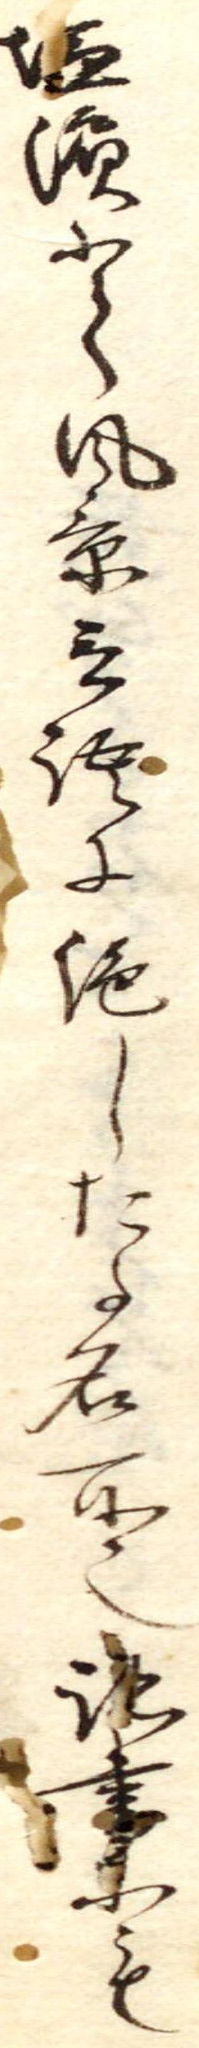塩浜にて風景言語に絶したる名所也記事にも
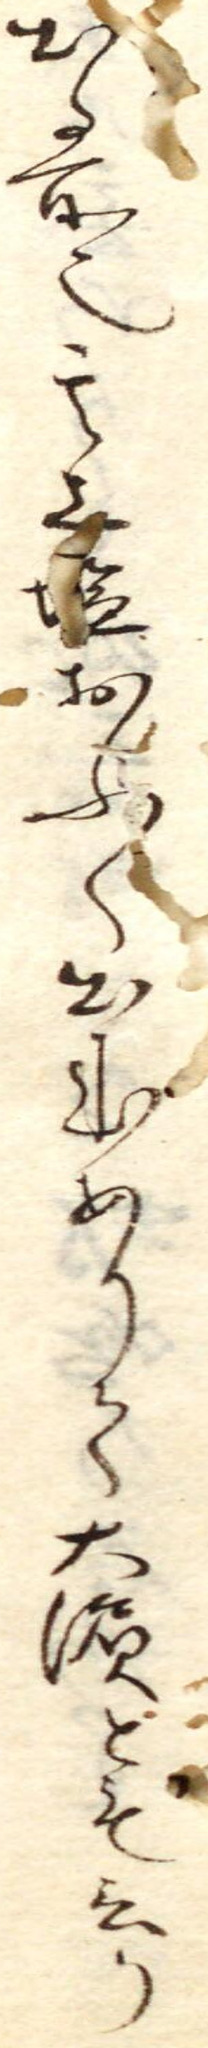出る所也其上塩おふく出来ありて大浜とも云り
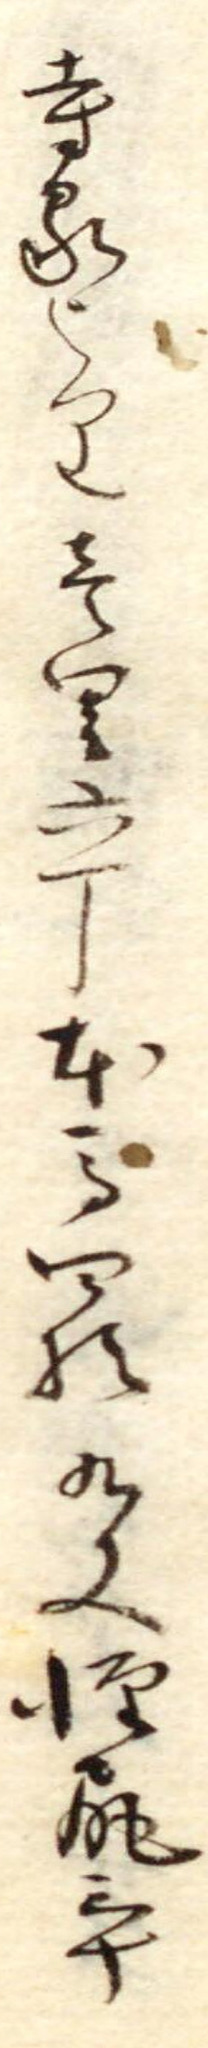寺家より壱里六丁本馬四拾九文軽尻三十
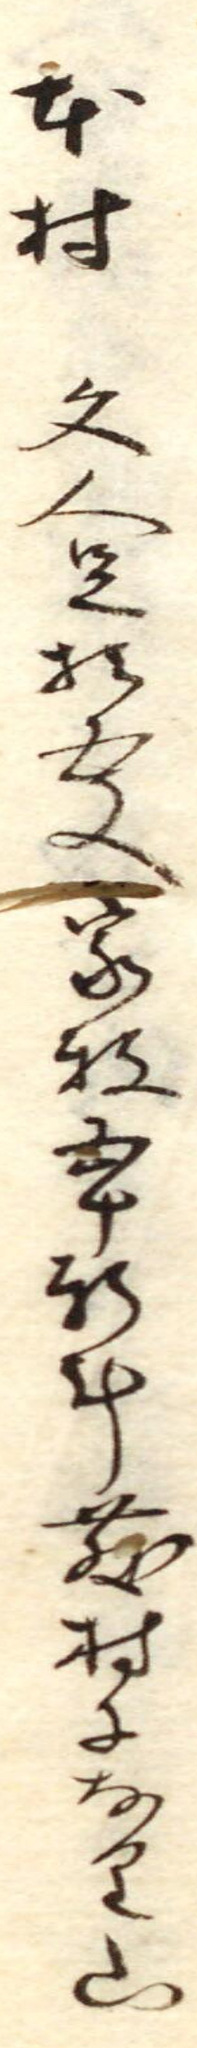本村文人足拾五文家数五十軒斗散村になり山
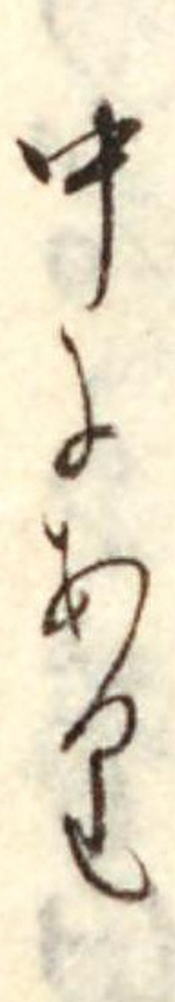中にあり
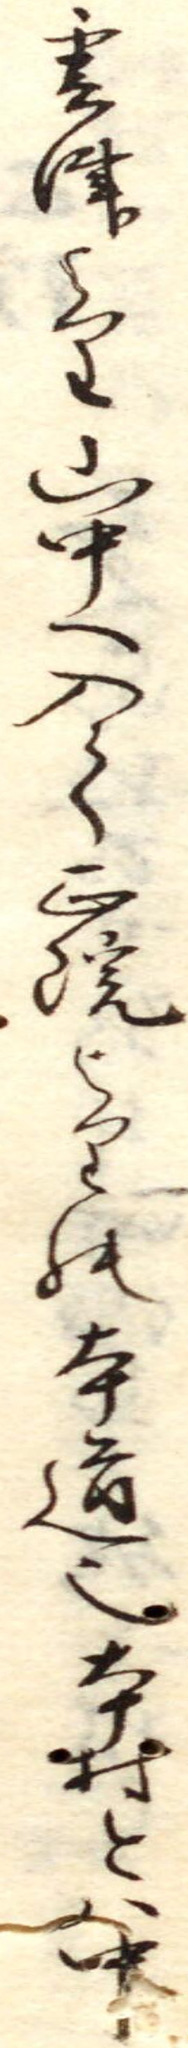雲津より山中へ入て正院よりの本道也本村とは中
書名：能登名跡誌
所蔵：Ishikawa Prefectural Library
